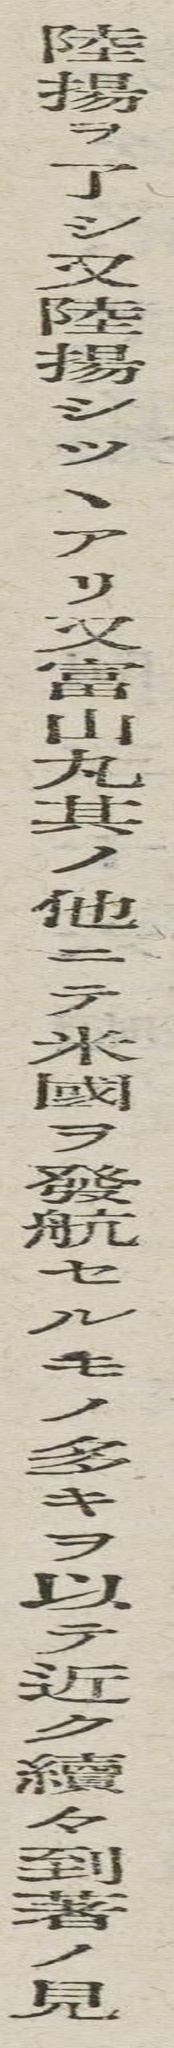陸揚ヲ了シ又陸揚シツヽアリ又富山丸其ノ他ニテ米国ヲ発航セルモノ多キヲ以テ近ク続々到着ノ見
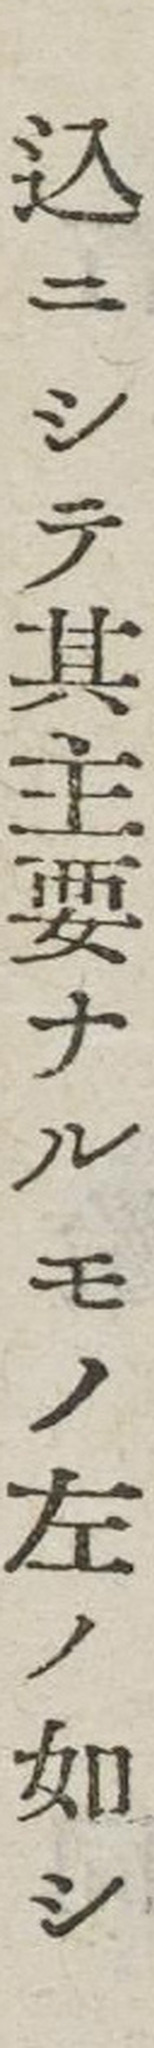込ニシテ其主要ナルモノ左ノ如シ
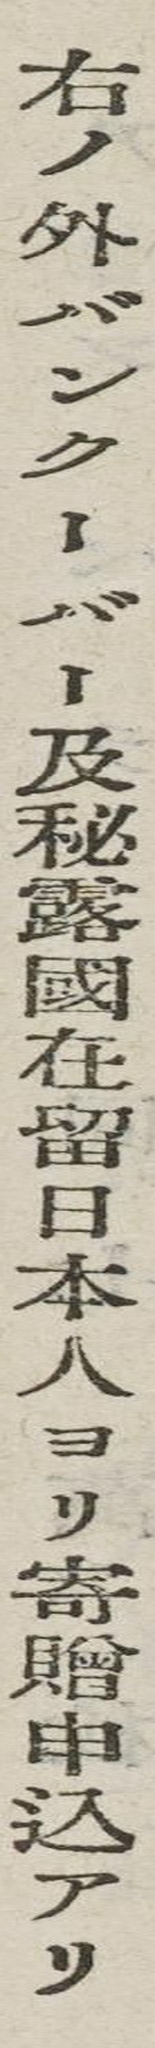右ノ外バンクーバー及秘露国在留日本人ヨリ寄贈申込アリ
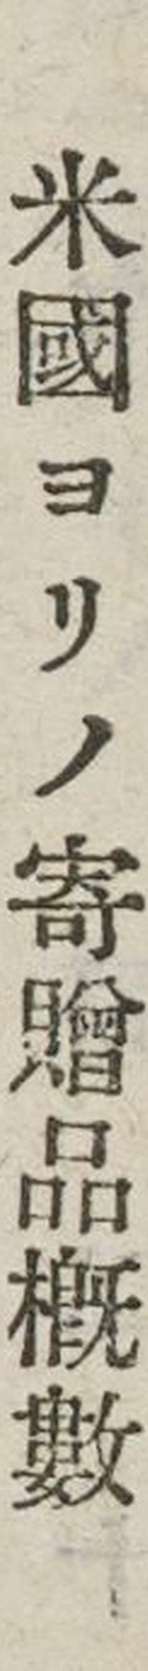米国ヨリノ寄贈品概数
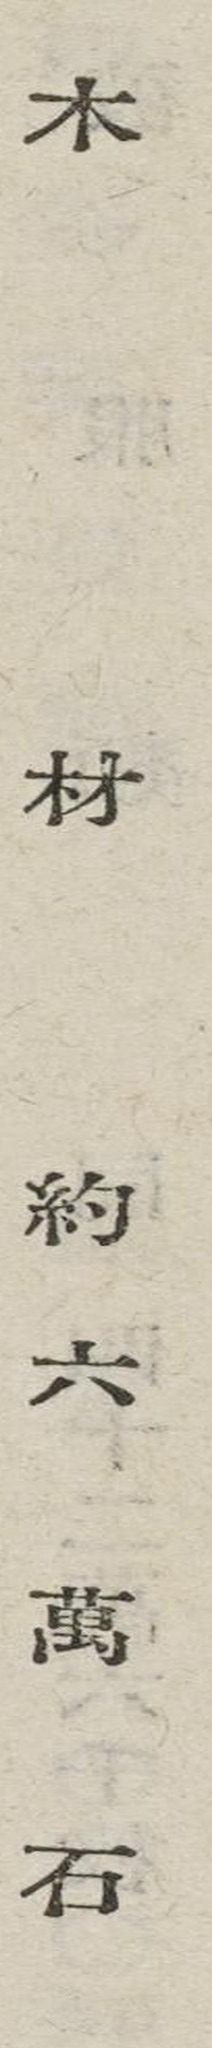木材約六万石
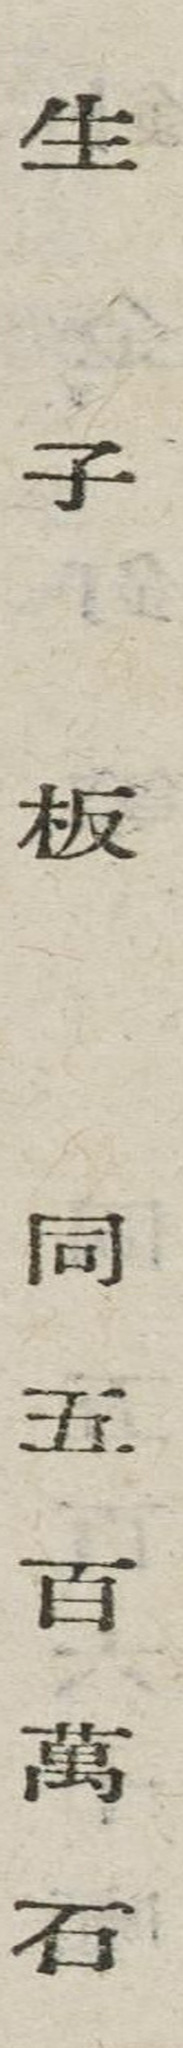生子板同五百万石

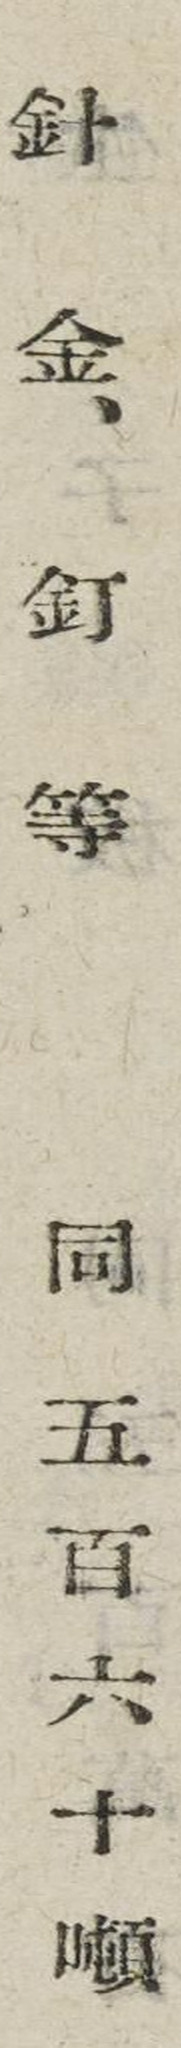針金釘等同五百六十噸
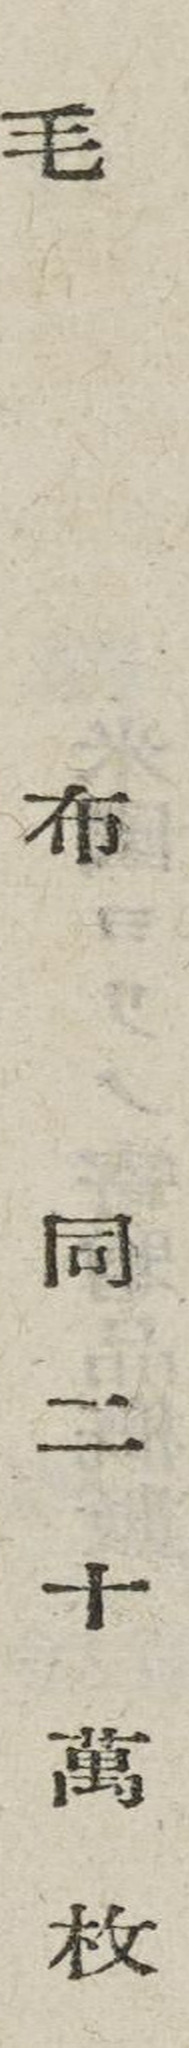毛布同二十万枚
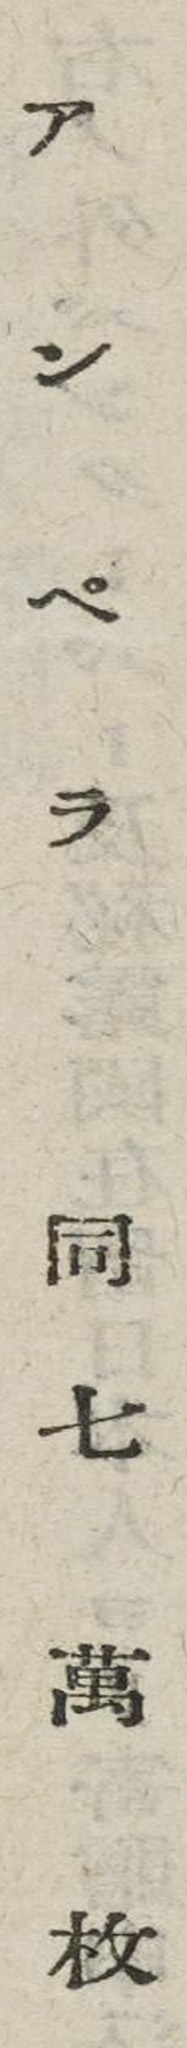アンペラ同七万枚
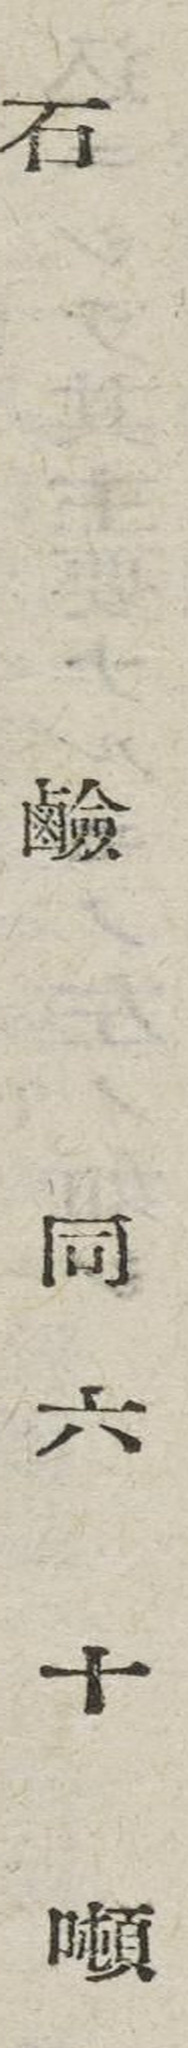石鹸同六十噸
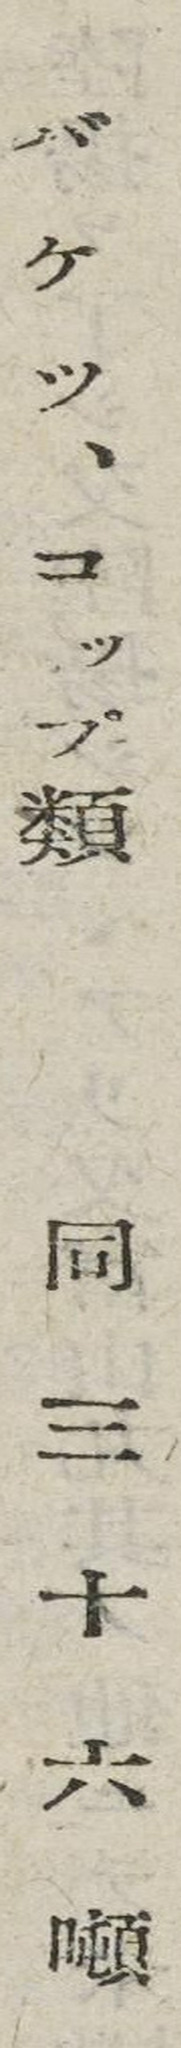バケツ、コップ類同三十六噸
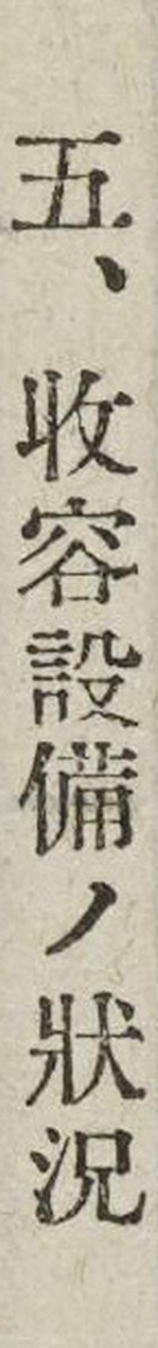五、収容設備ノ状況
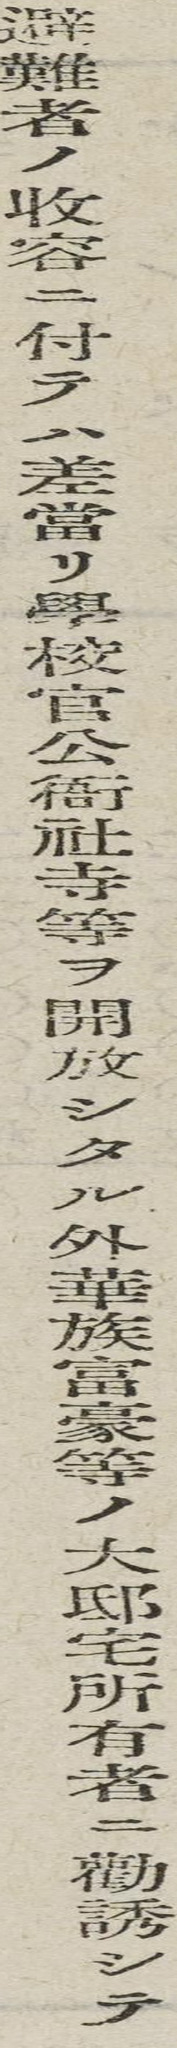避難者ノ収容ニ付テハ差当リ学校官公衙社寺等ヲ開放シタル外華族富豪等ノ大邸宅所有者ニ勧誘シテ
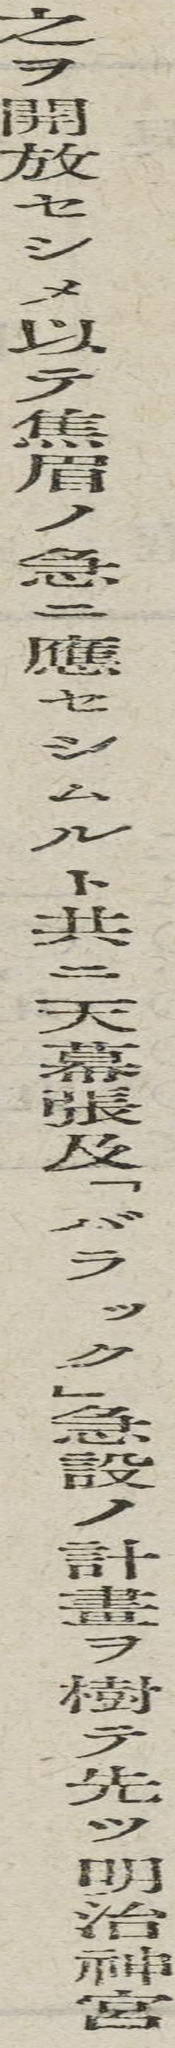之ヲ開放セシメ以テ焦眉ノ急ニ応セシムルト共ニ天幕張及「バラック」急設ノ計画ヲ樹テ先ツ明治神宮
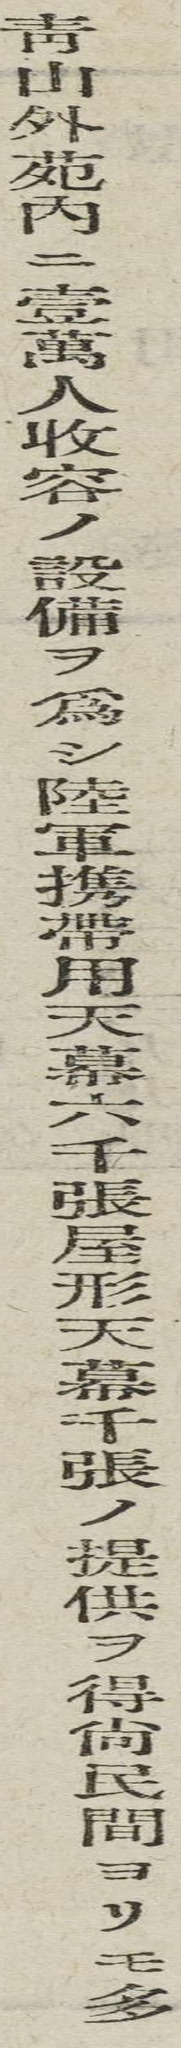青山外苑内ニ一万人収容ノ設備ヲ為シ陸軍携帯用天幕六千張屋形天幕千張ノ提供ヲ得尚民間ヨリモ多
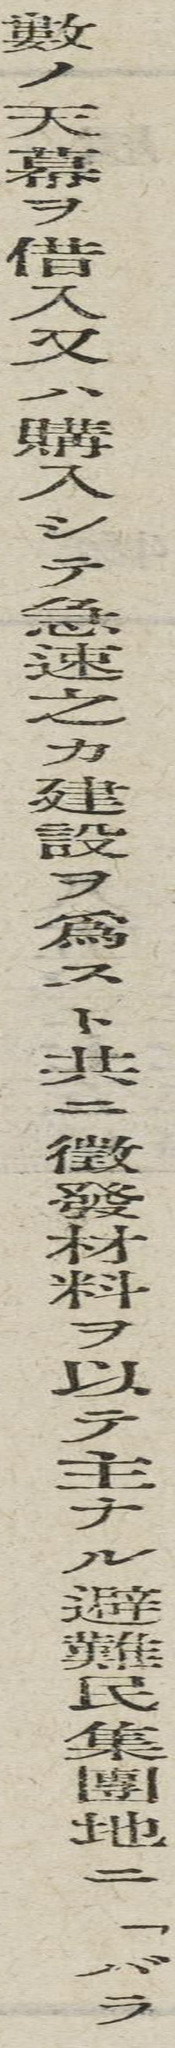数ノ天幕ヲ借入又ハ購入シテ急速之カ建設ヲ為スト共ニ徴発材料ヲ以テ主ナル避難民集団地ニ「バラ
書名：震災被害状況並救護施設概要
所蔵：東京大学地震研究所図書室 Earthquake Research Institute Library, The University of Tokyo, JAPAN
